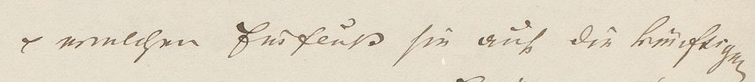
& welchen Einfluß sie auf die künftigen
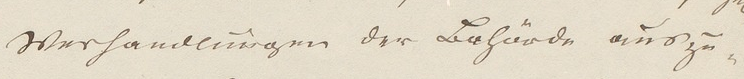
Verhandlungen der Behörde auszu-
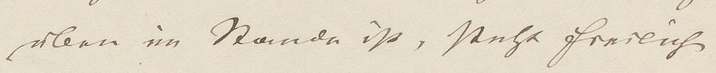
üben im Stande ist, steht freilich
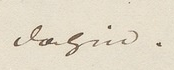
dahin.
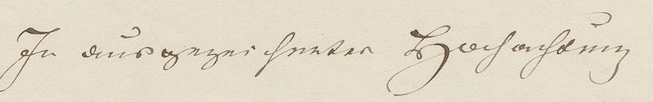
In ausgezeichneter Hochachtung
